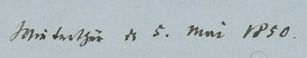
Winterthur den 5. Mai 1850.
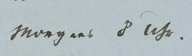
Morgens 8 Uhr.
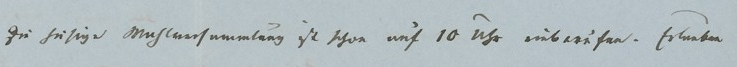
Die hiesige Wahlversammlung ist schon auf 10 Uhr einberufen. Erlauben
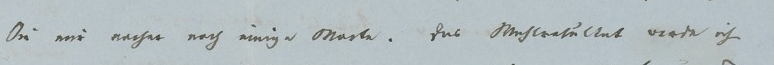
Sie mir vorher noch einige Worte. Das Wahlresultat werde ich
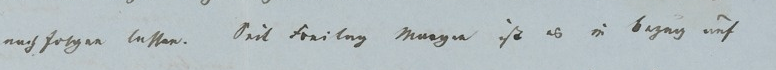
nachfolgen lassen. Seit Freitag Morgen ist es in Bezug auf
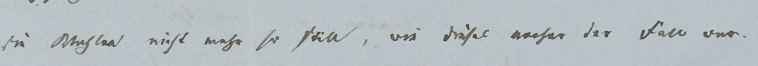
die Wahlen nicht mehr so still, wie dieses vorher der Fall war.
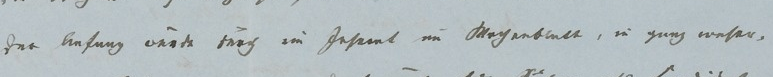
Der Anfang wurde durch ein Inserat im Morgenblatt, in ganz conser-
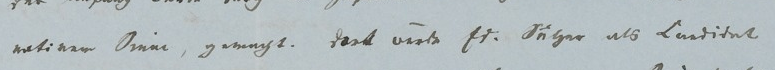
vativem Sinne, gemacht. Dort wurde Ed. Sulzer als Candidat
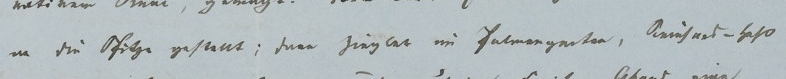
an die Spitze gestellt; dann Ziegler im Palmengarten, Reinhard-Heß
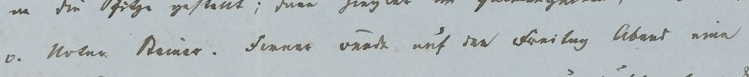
&. Notar Steiner. Ferner wurde auf den Freitag Abend eine
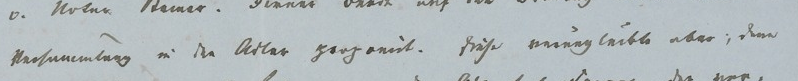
Versammlung in den Adler proponirt. Diese verunglückte aber; denn
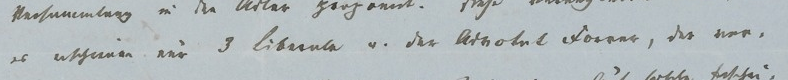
es erschienen nur 3 Liberale &. der Advokat Forrer, der ver-
